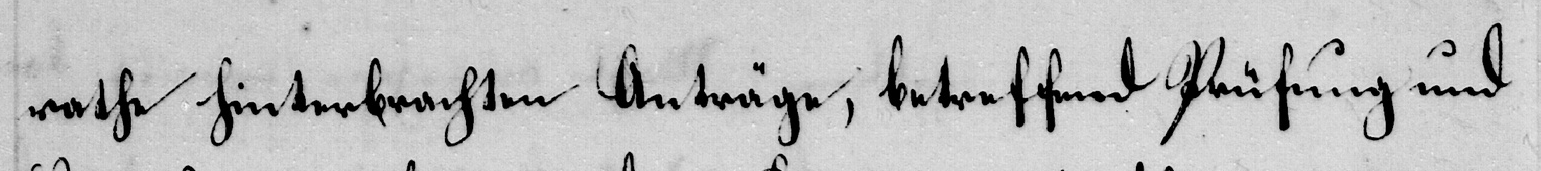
rathe hinterbrachten Anträge, betreffend Prüfung und
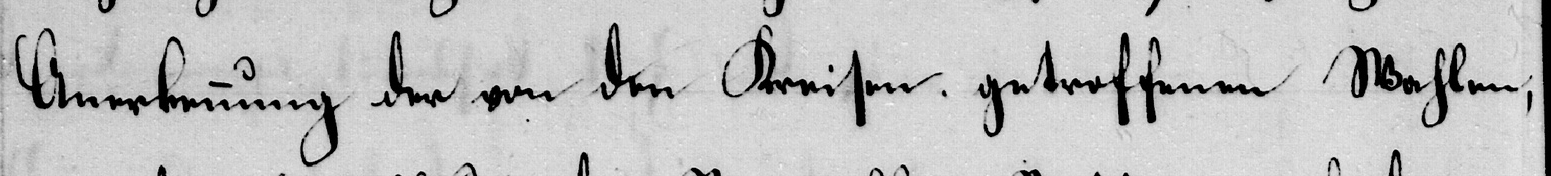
Anerkennung der von den Kreisen getroffenen Wahlen,
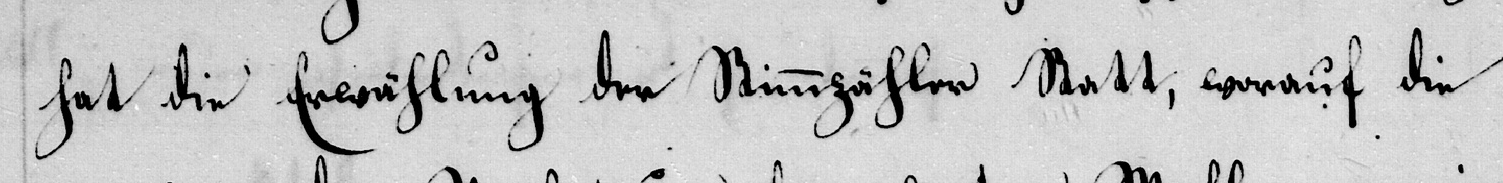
hat die Erwählung der Stimmzähler Statt, worauf die
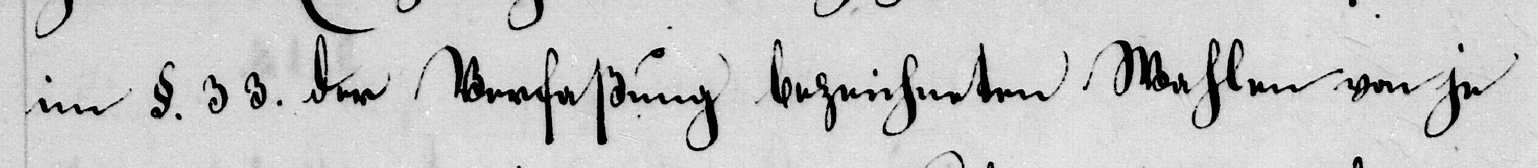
im §.33. der Verfaßung bezeichneten Wahlen von je
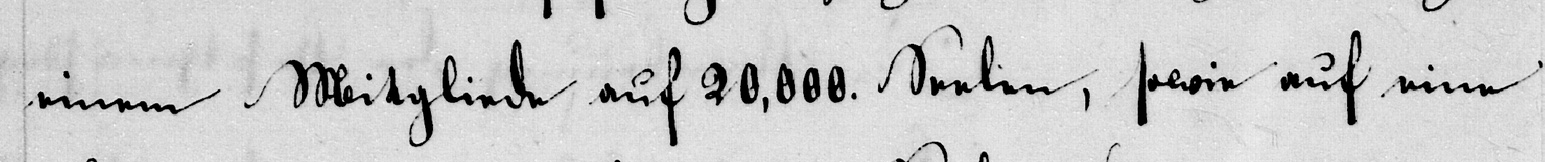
einem Mitgliede auf 20,000 Seelen, sowie auf eine
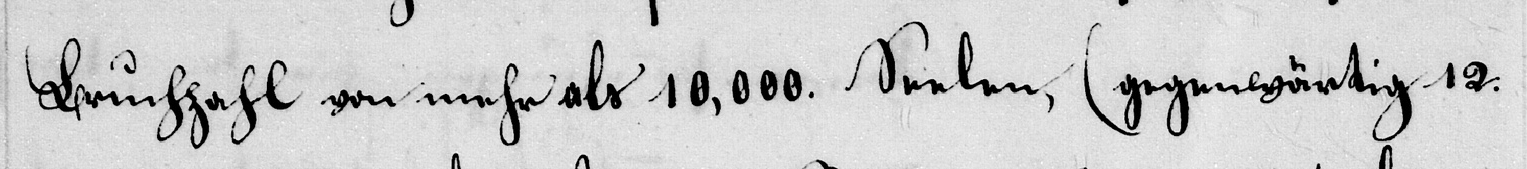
Bruchzahl von mehr als 10,000 Seelen, (gegenwärtig 12.
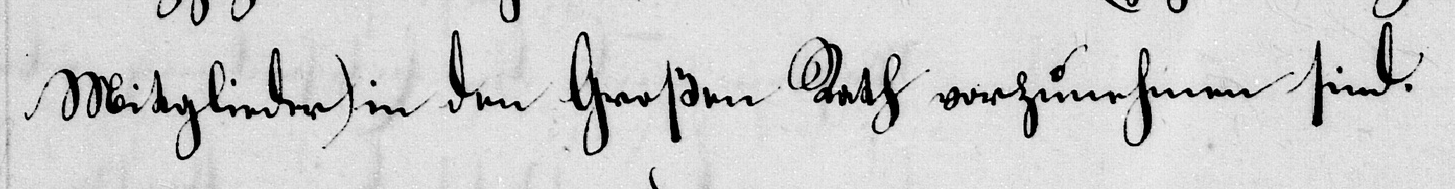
Mitglieder) in den Großen Rath vorzunehmen sind.
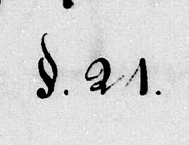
§.21.
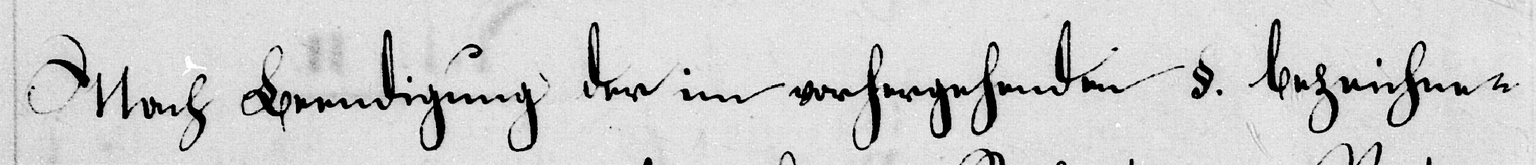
Nach Beendigung der im vorhergehenden §. bezeichne¬
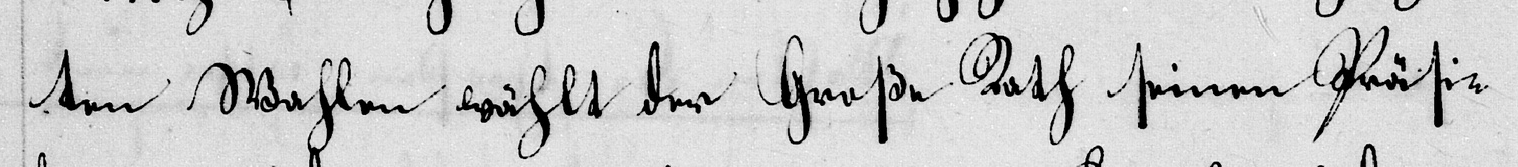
ten Wahlen wählt der Große Rath seinen Präsi¬
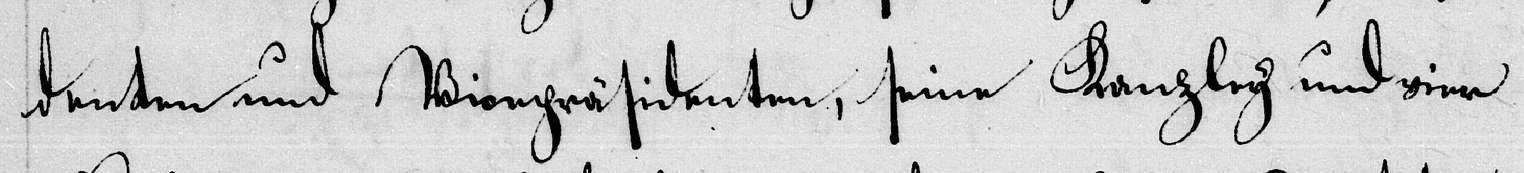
denten und Vicepräsidenten, seine Kanzley und vier
